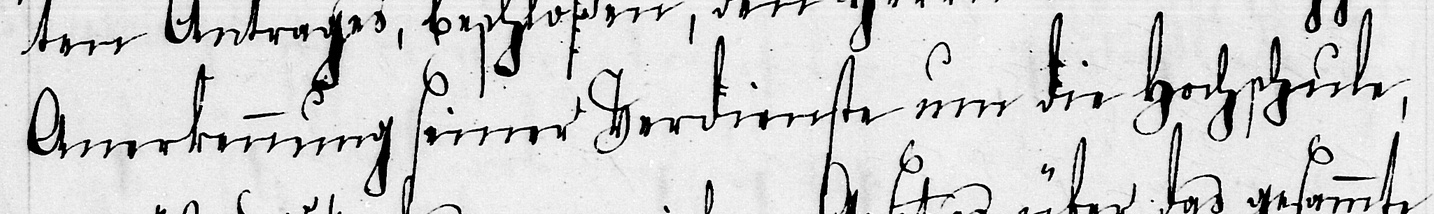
Anerkennung seiner Verdienste um die Hochschule,
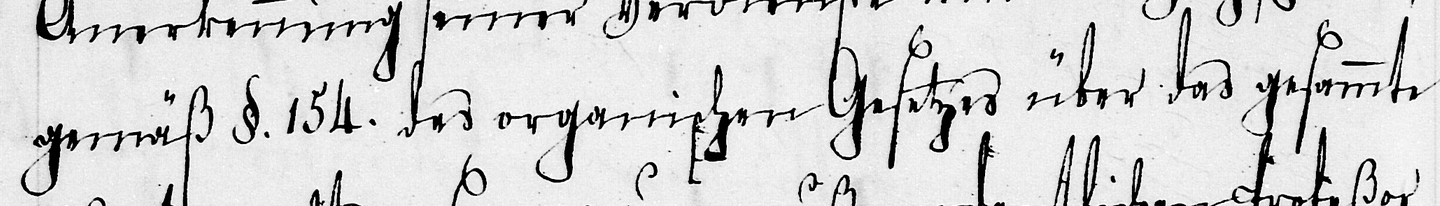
gemäß §. 154. des organischen Gesetzes über das gesammte
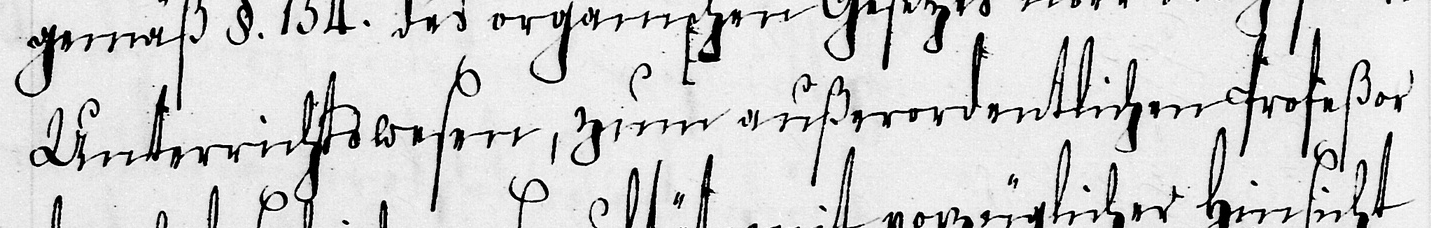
Unterrichtswesen, zum außerordentlichen Profeßor
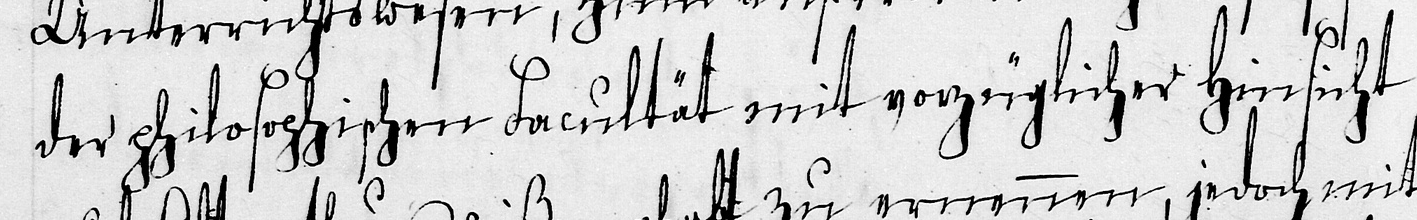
der philosophischen Facultät mit vorzüglicher Hinsicht
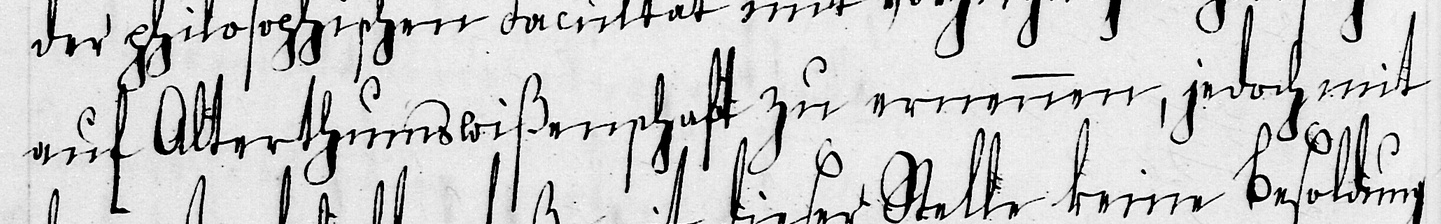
auf Alterthumswißenschaft zu ernennen, jedoch mit
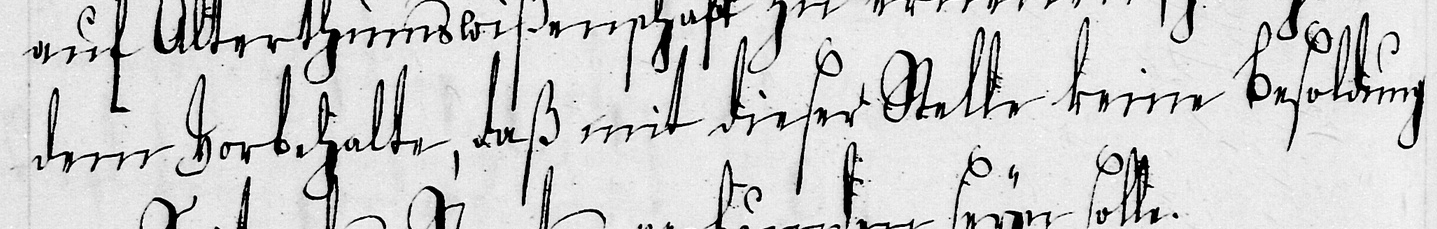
dem Vorbehalte, daß mit dieser Stelle keine Besoldung
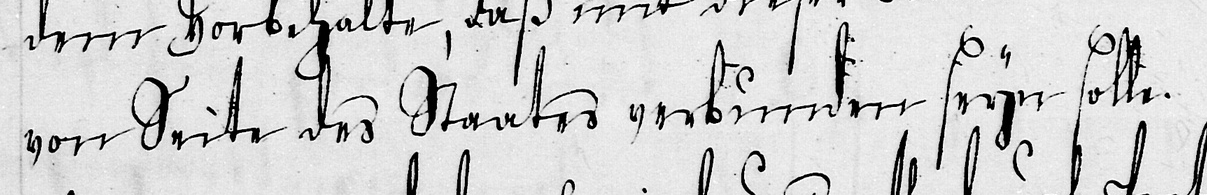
von Seite des Staates verbunden seyn soll¬
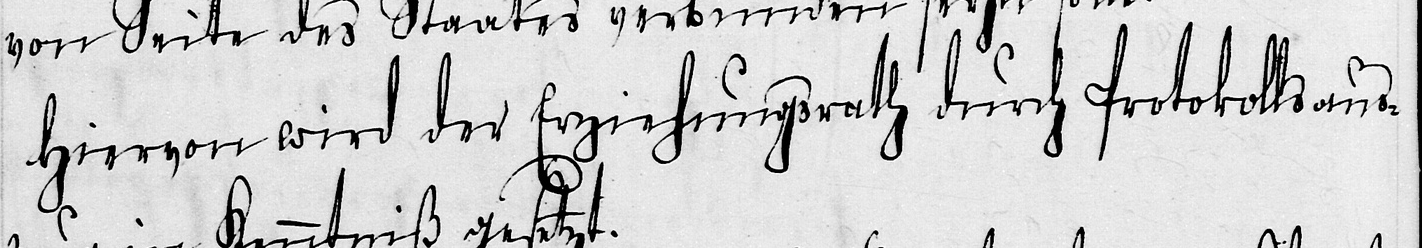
Hiervon wird der Erziehungsrath durch Protokollsaus¬
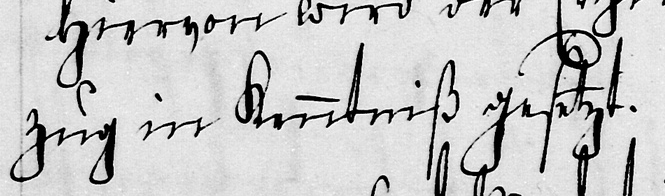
zug in Kenntniß gesetzt.
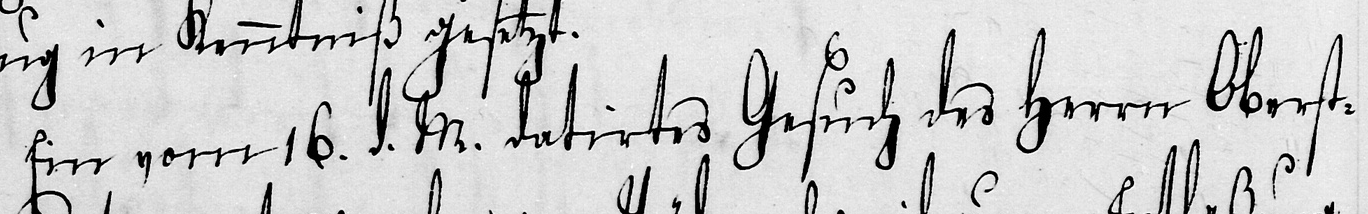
Ein vom 16. d. M. datirtes Gesuch des Herrn Oberst¬
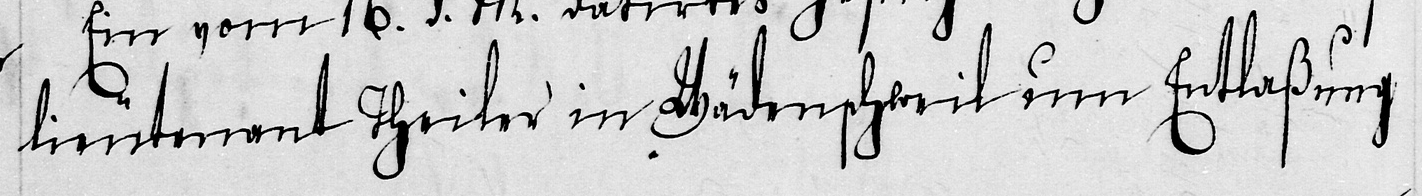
lieutenant Theiler in Wädenschweil um Entlaßung
